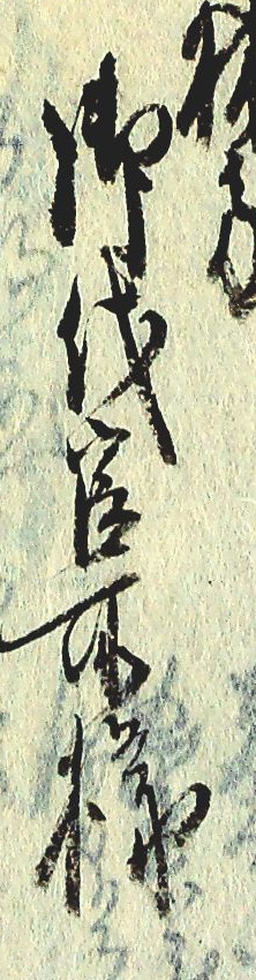御代官所様
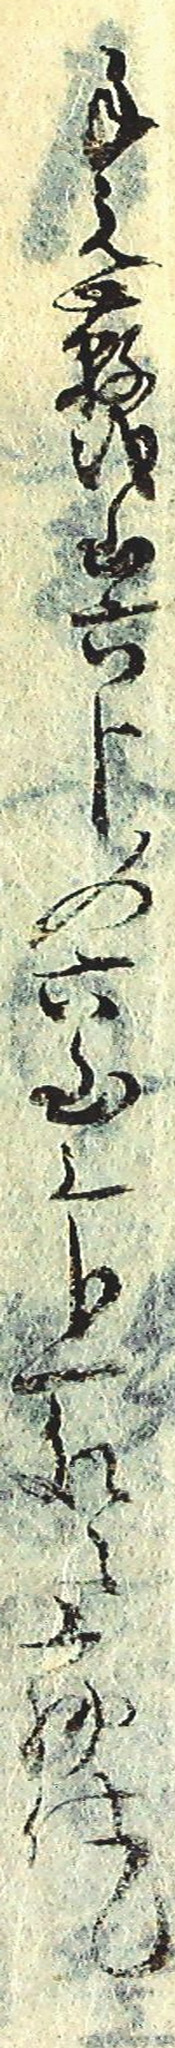手元藪弐匁六分〆六匁三分一処に上納仕候
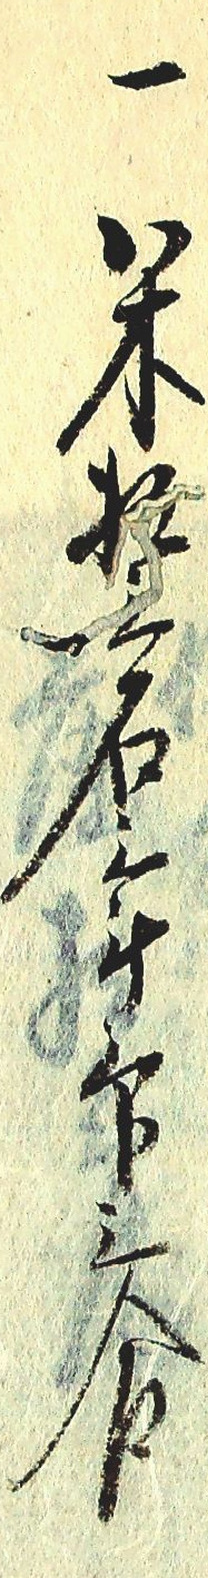一米拾三石三斗三升三合
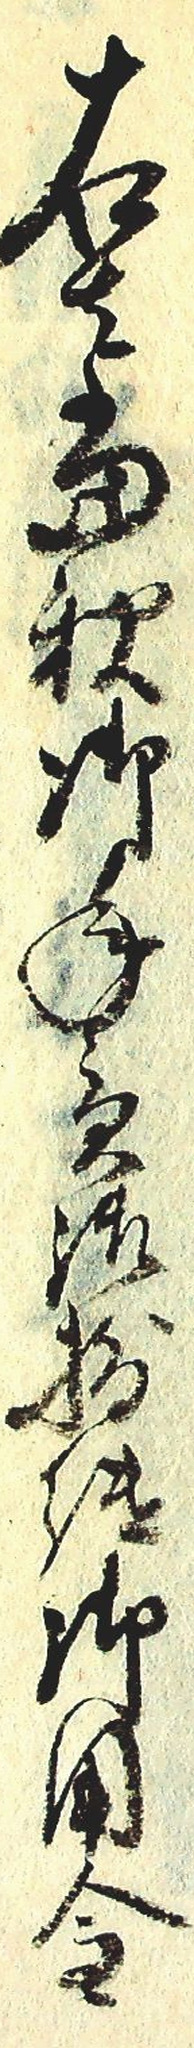右は当秋御年貢御指継御用金
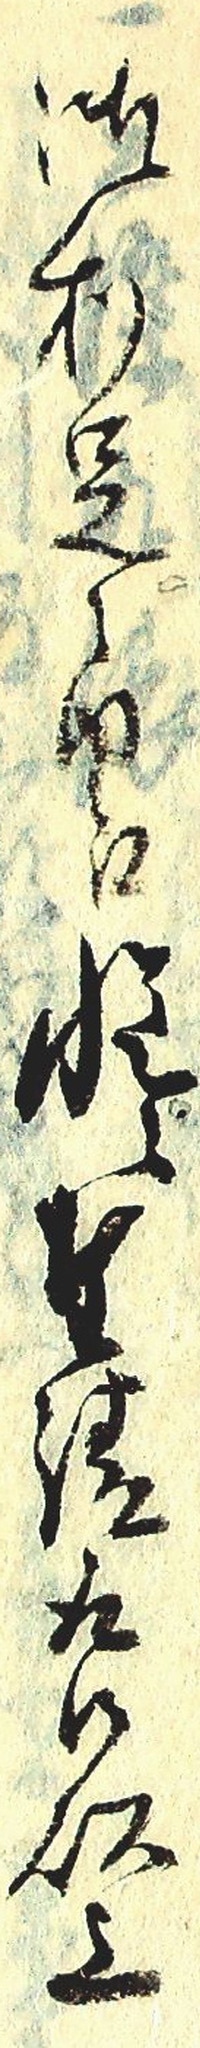御利足之内え慥に奉請取候以上
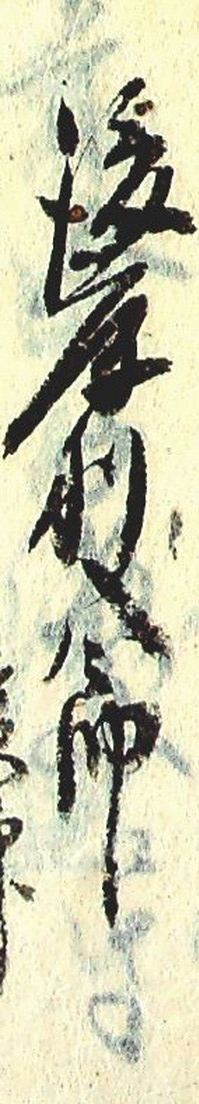後藤利八郎
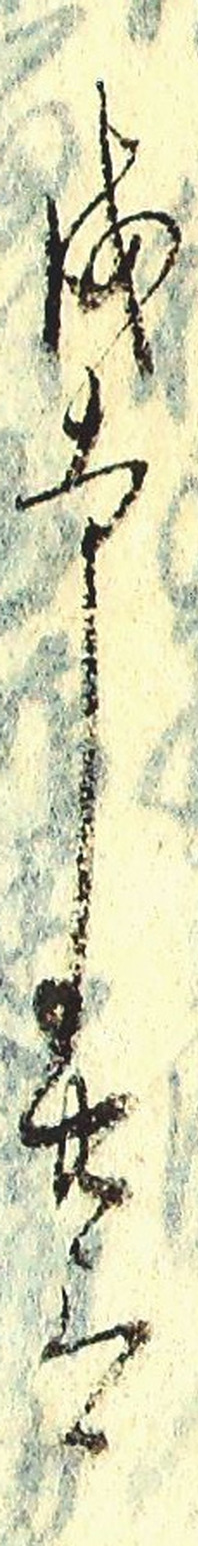戌十一月廿二日
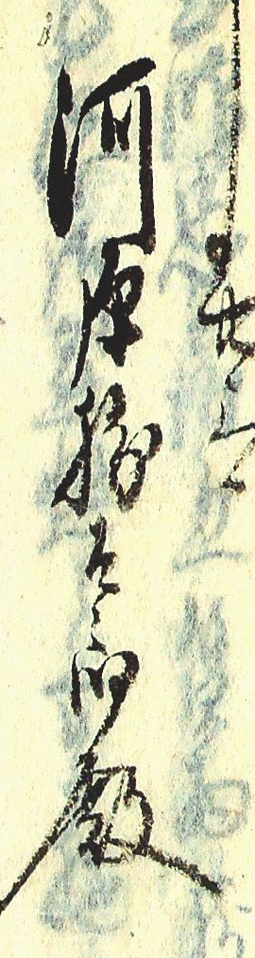河原勝太郎殿

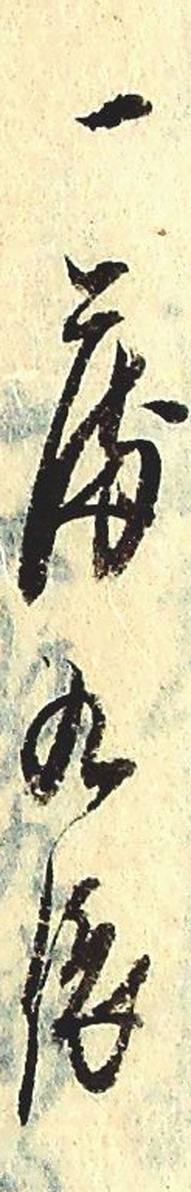一蒅九俵
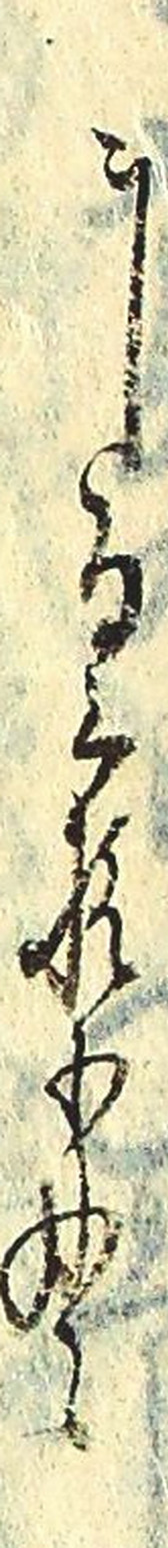正百三拾五貫
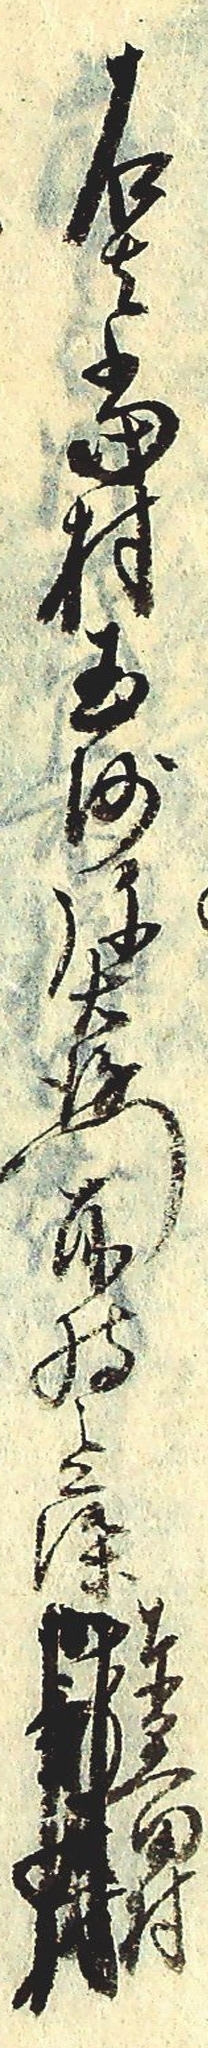右は当村玉師弥右衛門所持之蒅東黒田村
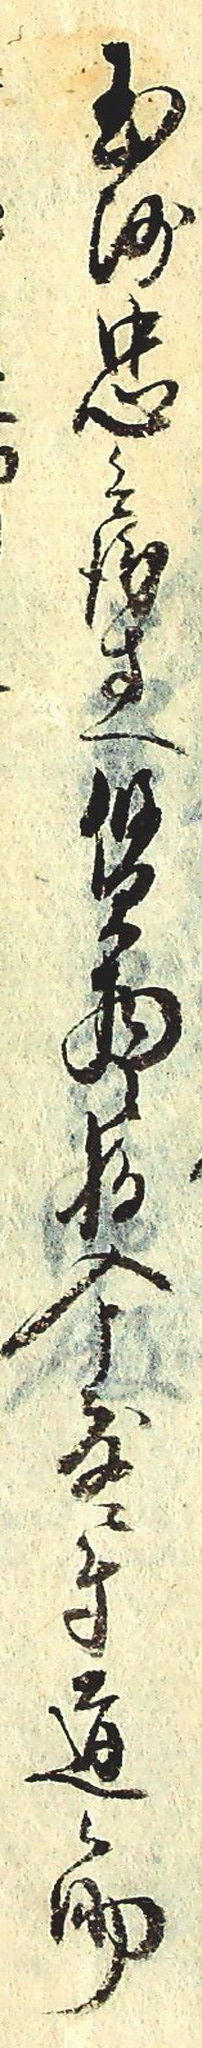玉師忠兵衛方へ質物に指入申度に付道筋
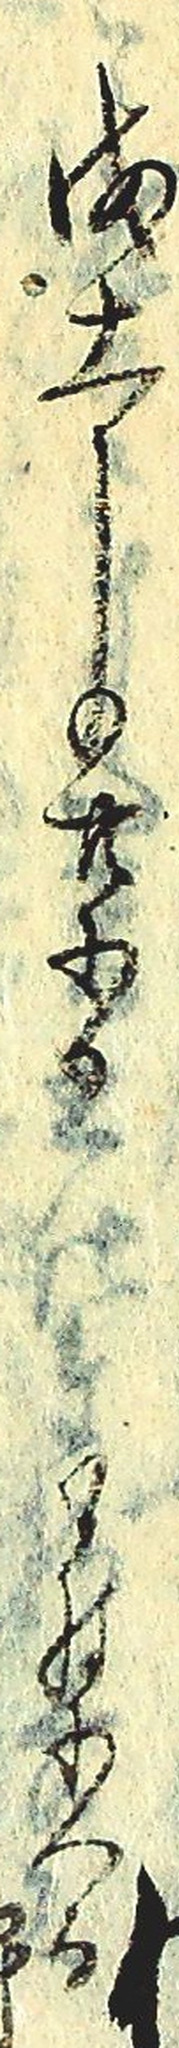戌十一月廿五日同村五人与
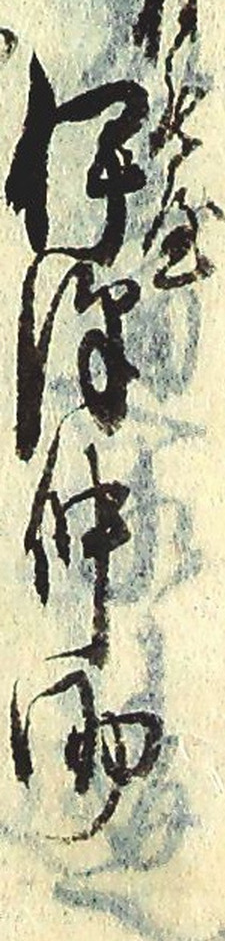伊沢仲助
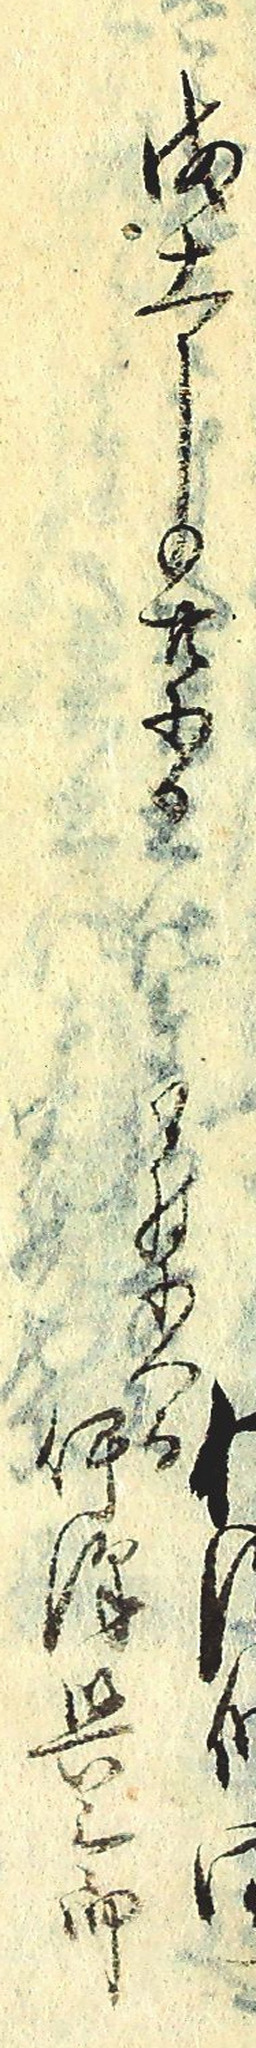戌十一月廿五日同村五人与
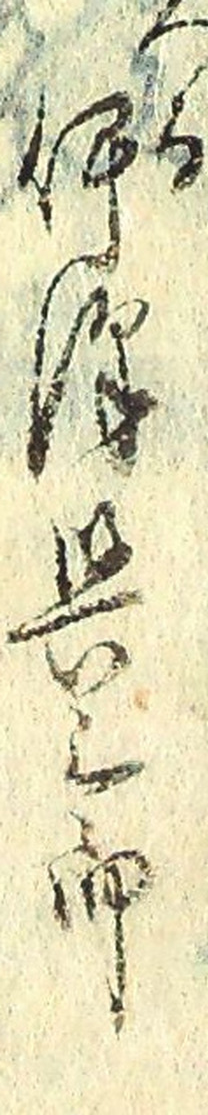伊沢与三郎
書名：諸御願書控(弐番）
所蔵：鳴門教育大学 Naruto University of Education
